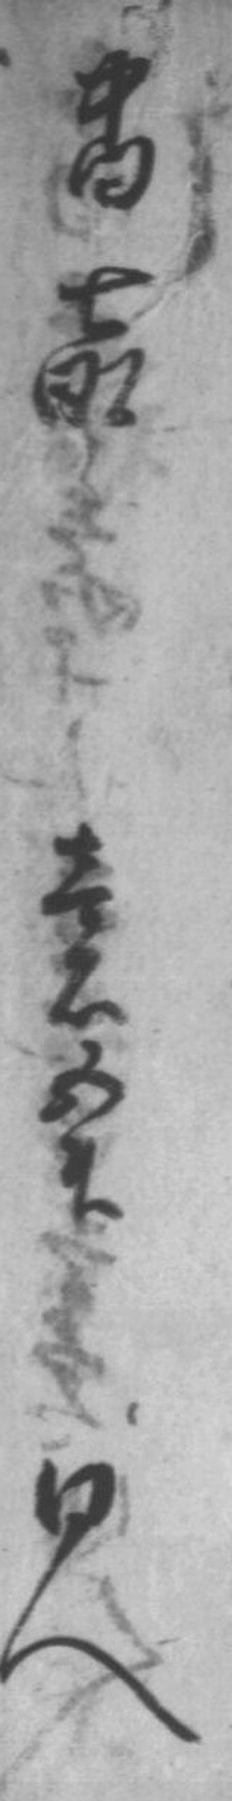中田七畝壱石五斗同人
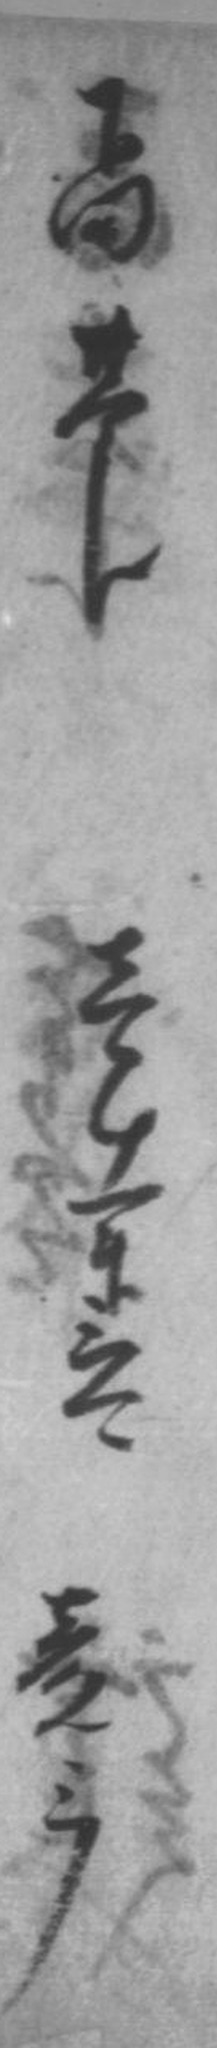下田廿一文壱斗一升三合彦三郎
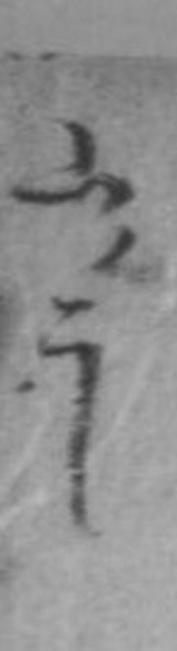山ノこし
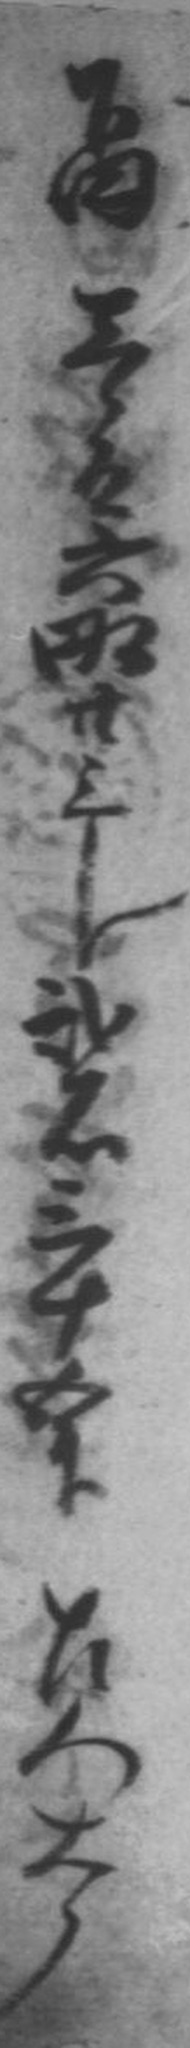下田壱反六畝廿三分㊞弐石三斗五升左衛門太郎

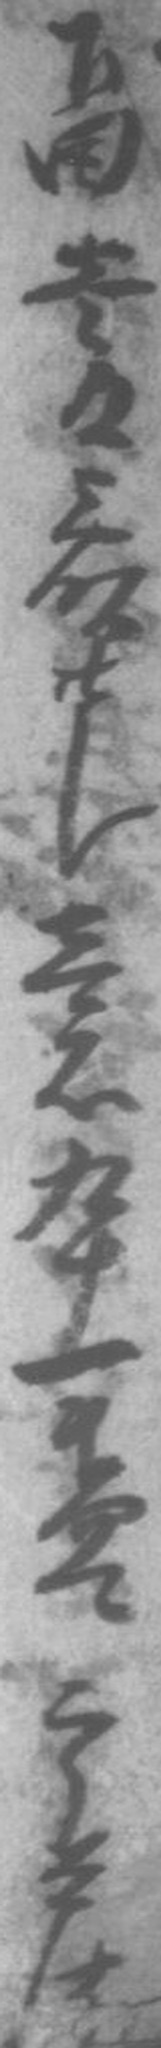下田壱反三畝廿分壱石九斗一升四合二郎兵衛
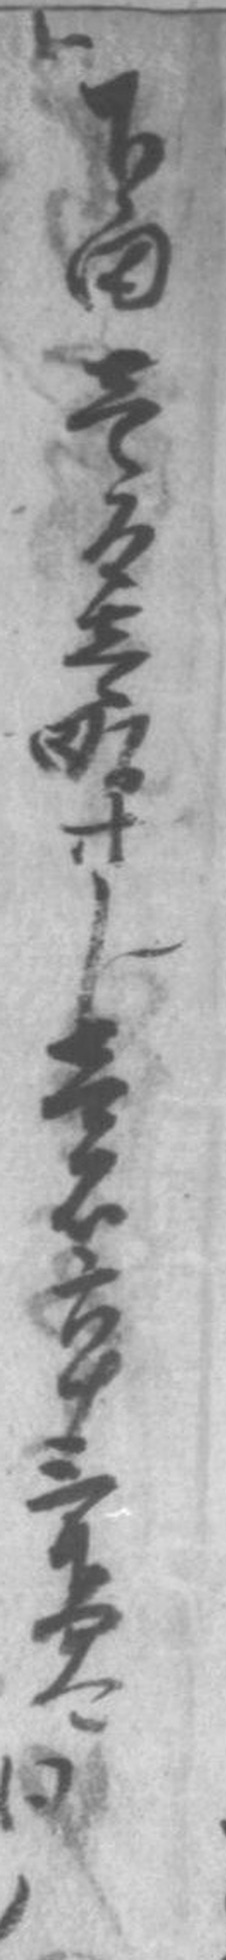下田壱反一畝廿分壱石六斗三升四合同人
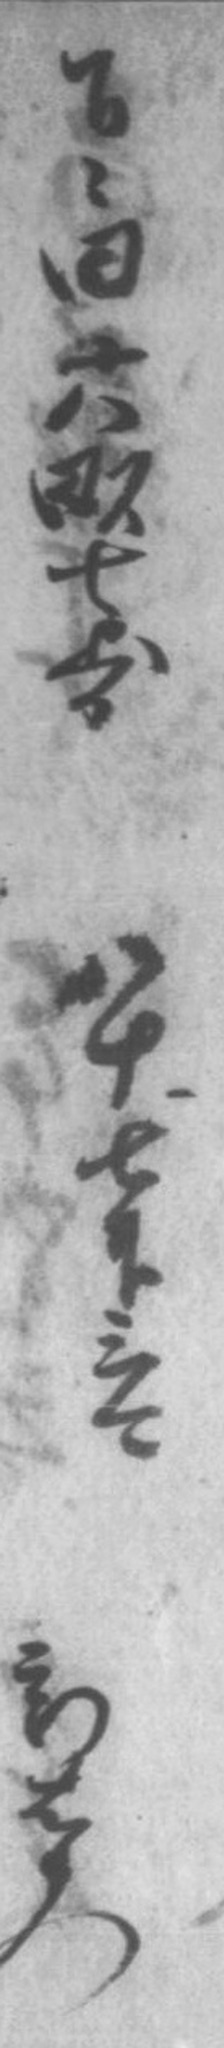下々田六畝七歩八斗七升三合新右衛門
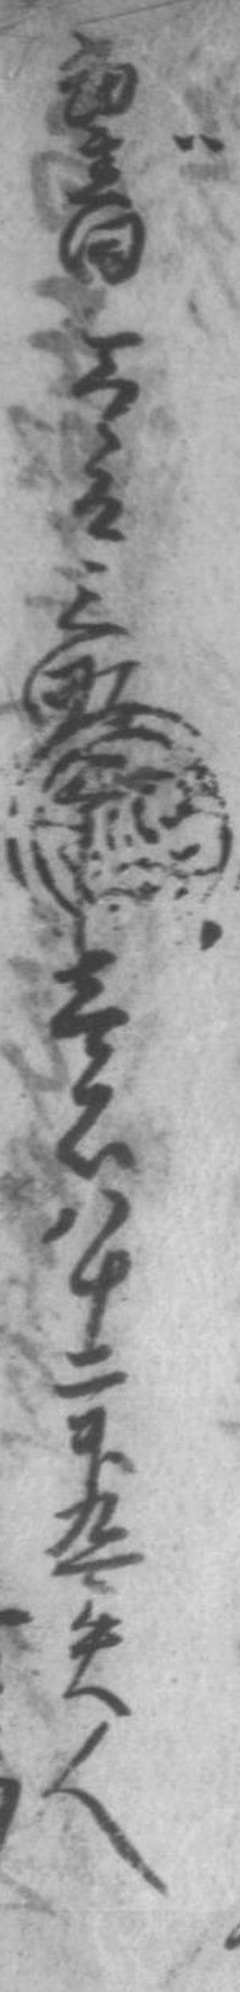当荒田壱反三畝㊞壱石八斗二升九合失人
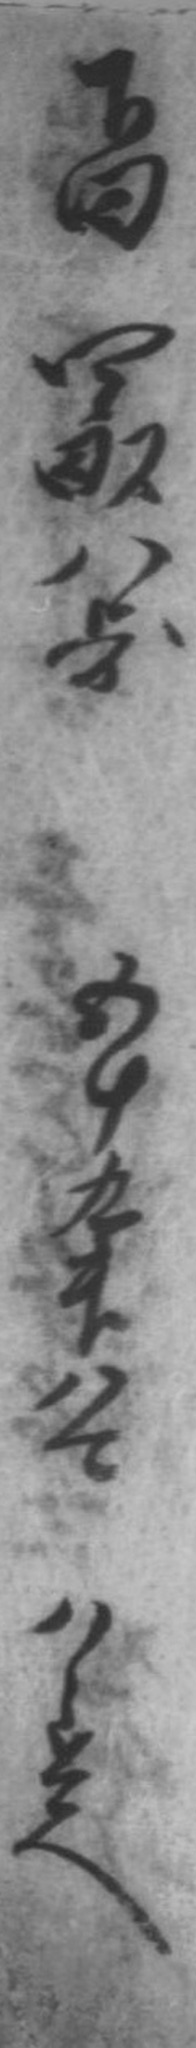下田四畝八歩五斗九升八合八郎兵衛

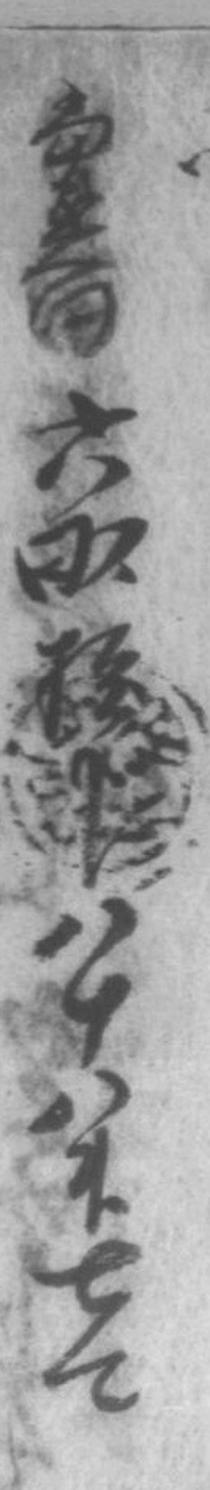当荒田六畝拾分㊞八斗八升七合同人
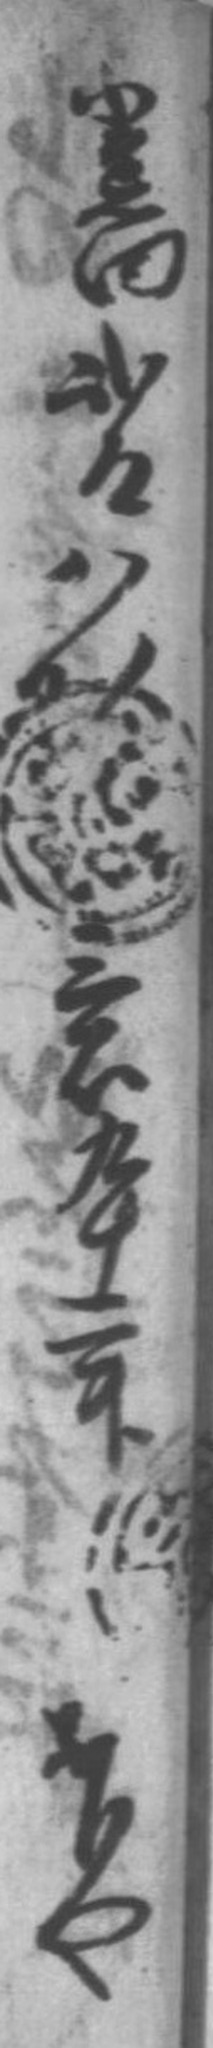当荒田弐反八畝㊞三石九斗二升おりや
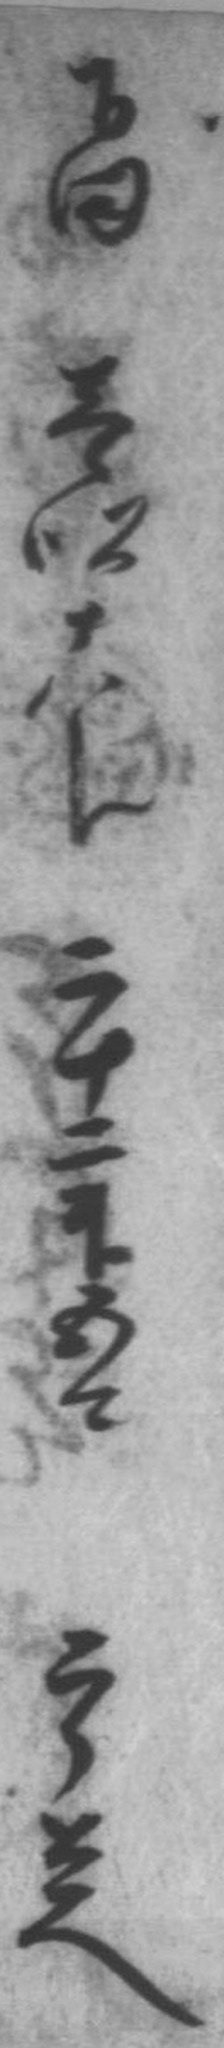下田壱畝十八分二斗二升五合二郎兵衛
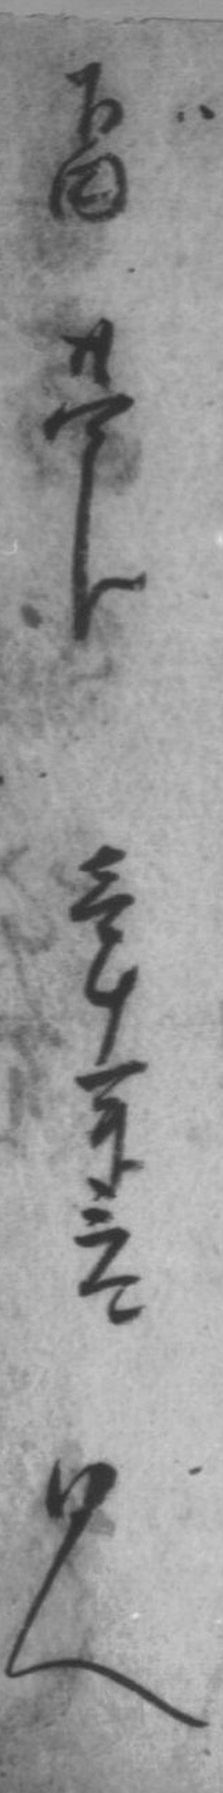下田廿四分壱斗一升三合同人

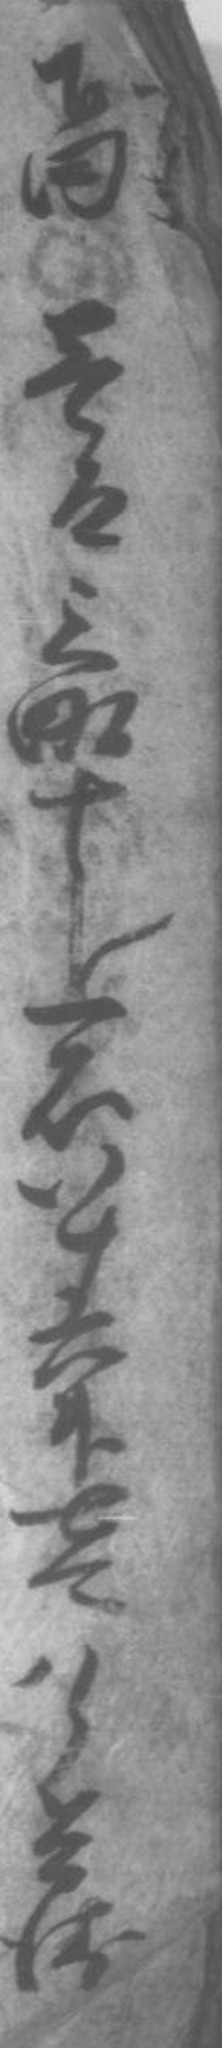下田壱反三畝十分一石八斗六升七合八郎兵衛
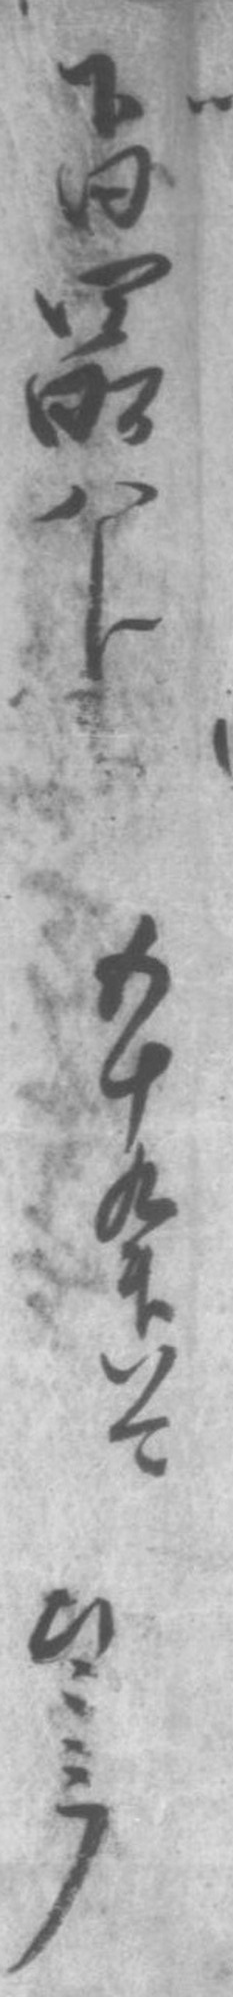下田四畝八分五斗九升八合ひこ三郎
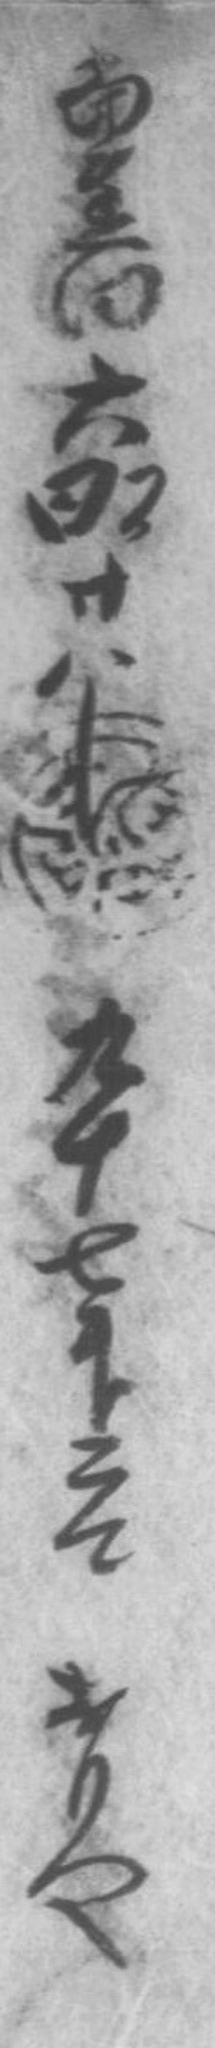当荒田六畝廿八分㊞九斗七升二合おりや
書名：越州大野郡ノ内不動堂村御検地帳
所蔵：福井県文書館 Fukui Prefectural Archives
